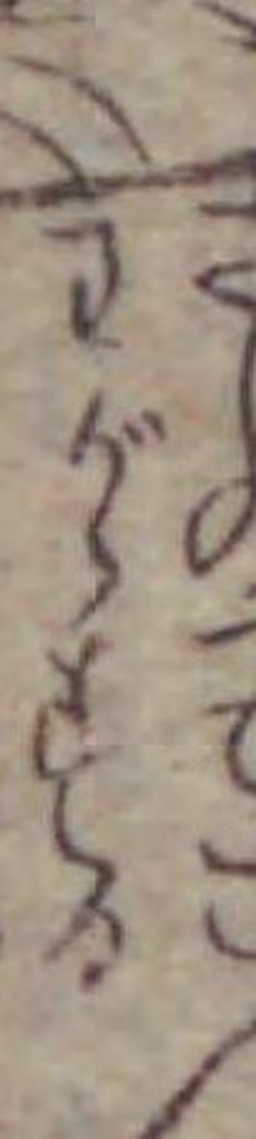わがらする
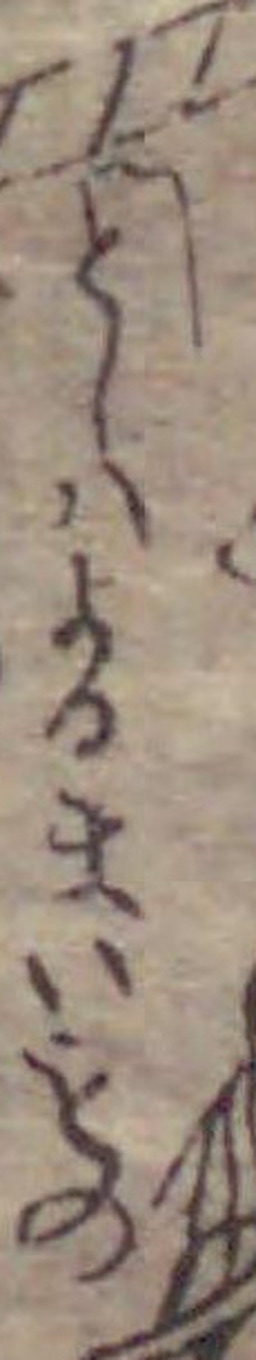〽としはよるまいもの
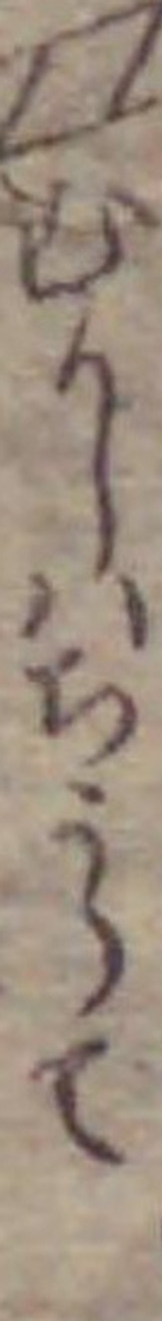むかしはちからて
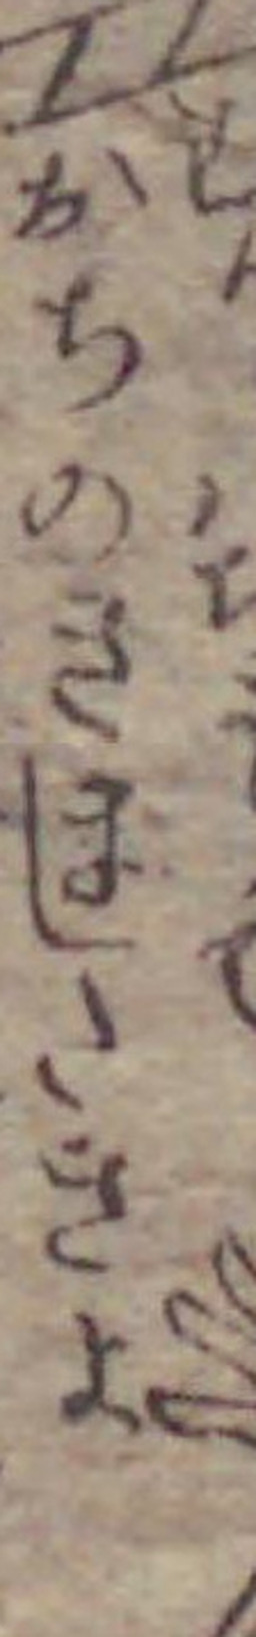おちのきましたきよ
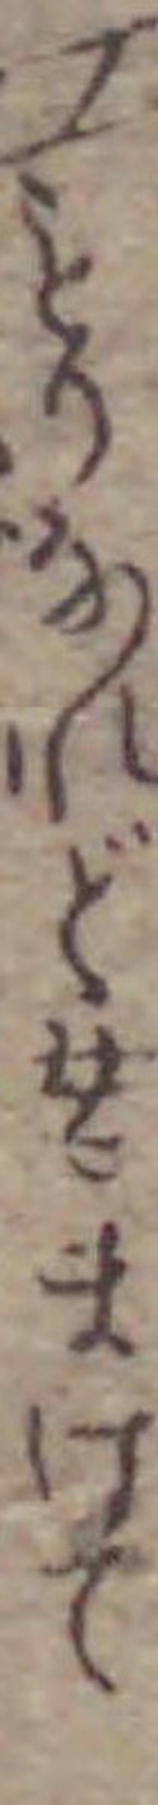もりなれど女にまけて
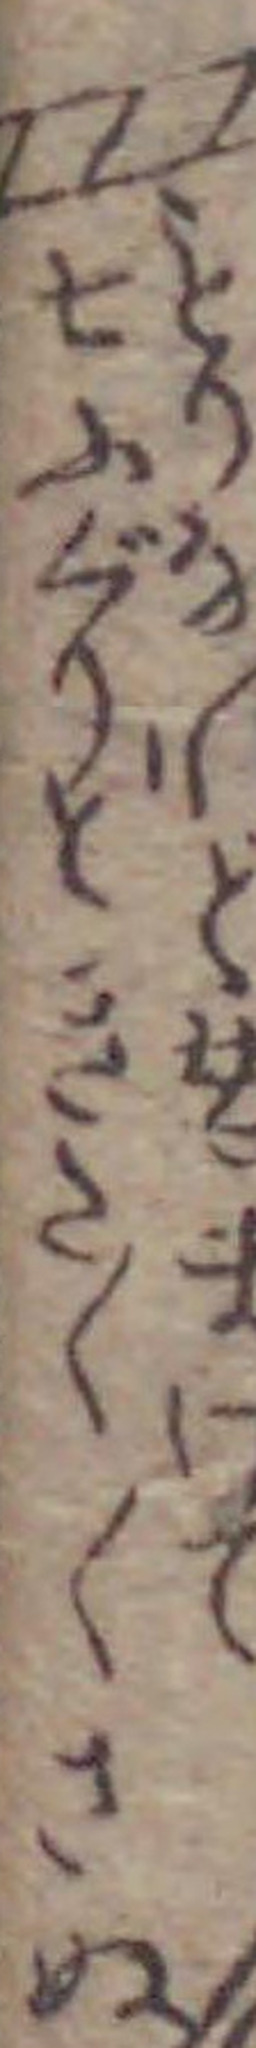七ふぐりときた〳〵〳〵さぬ
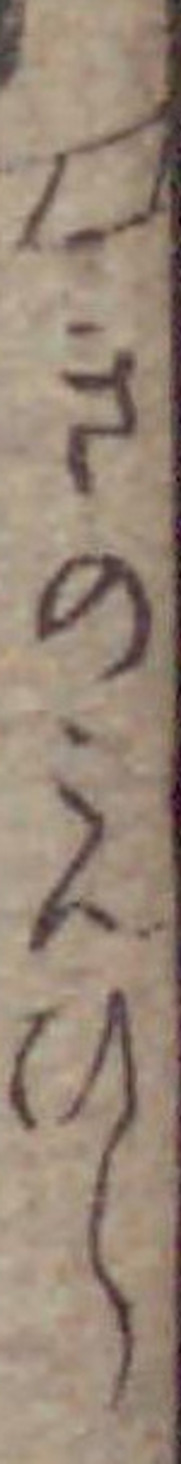きのこんひら
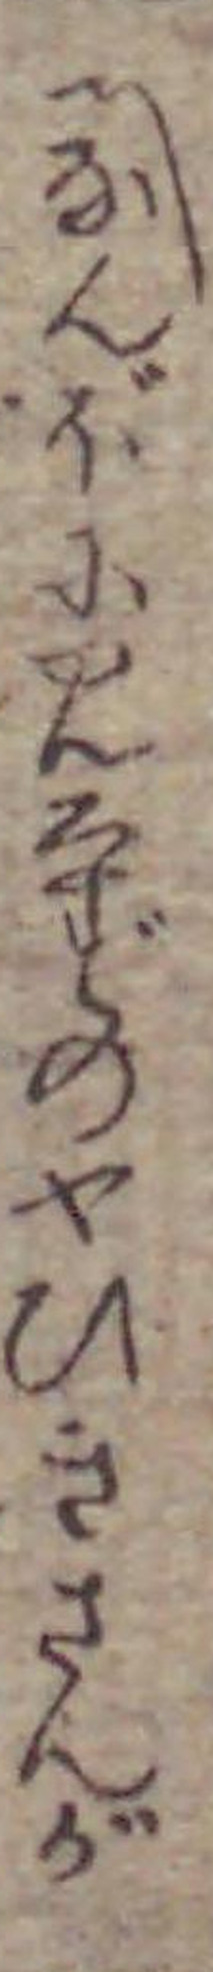〽なんぼにやんなどのやひきさんが
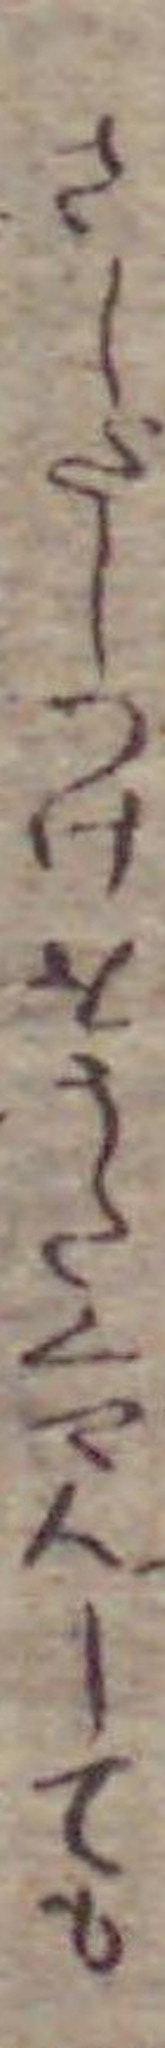さしだしつけをかたしやんしても
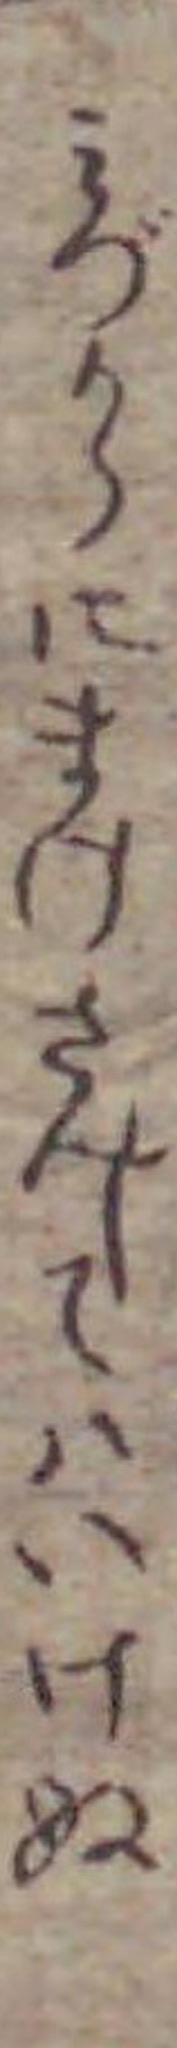みづからにまけさんしてはいけぬ
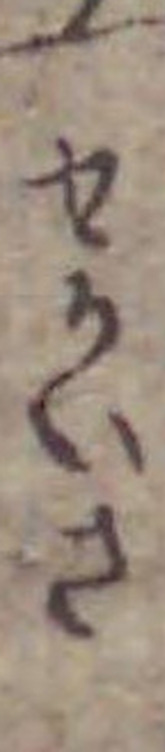せかいさ
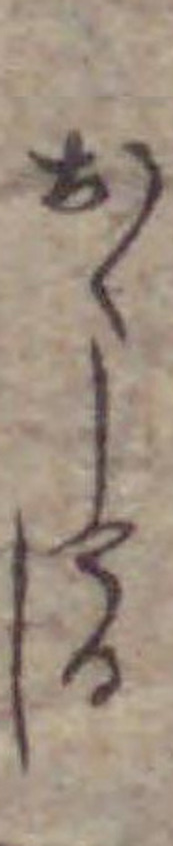おゝしやるし
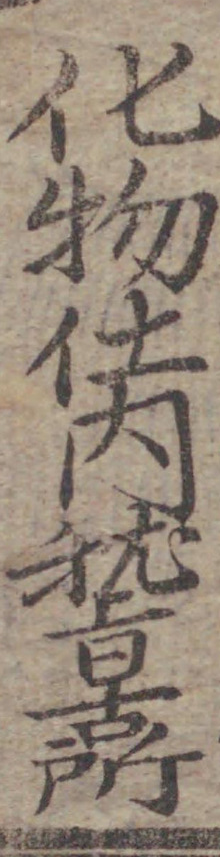化物仕内稽古所
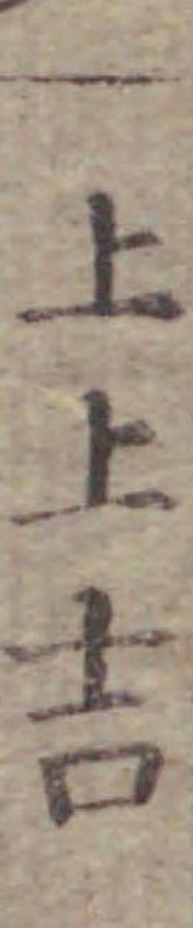上上吉
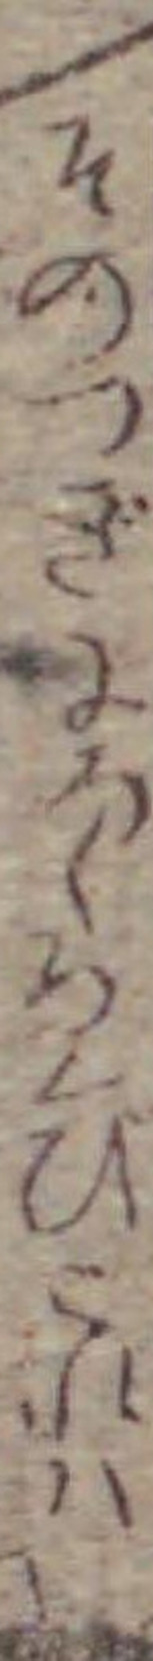そのつぎにろくろくびこれは
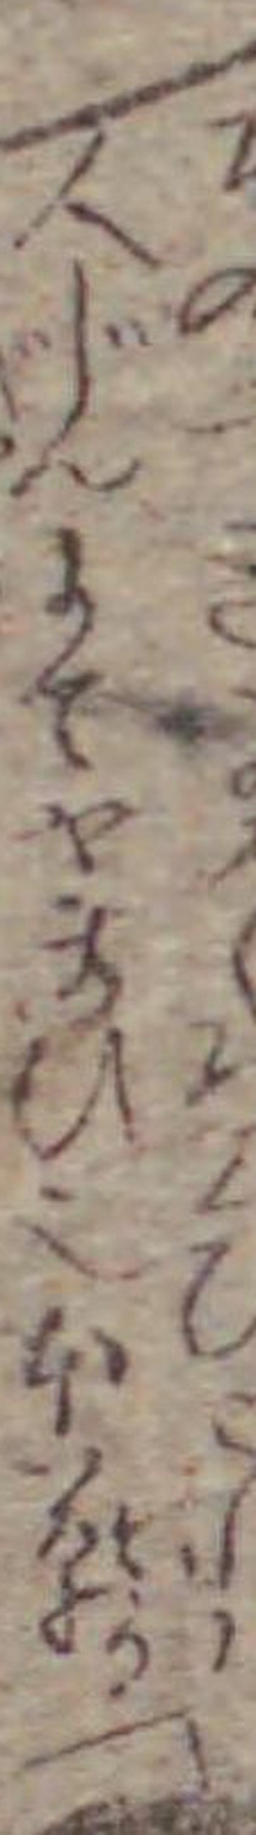人じんにてやまひ也本草
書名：妖怪仕内評判記 : 2巻
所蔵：国立国会図書館 National Diet Library, JAPAN
